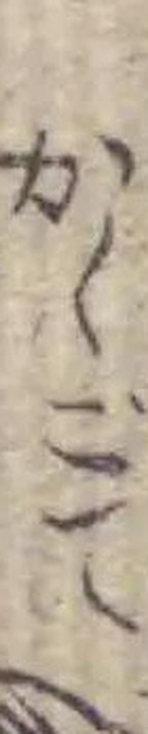かくごで
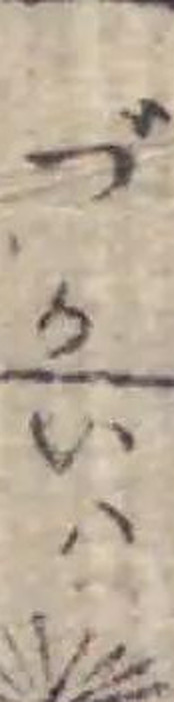づかいは
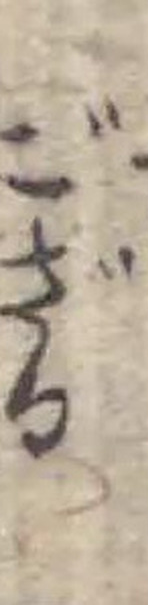ござる
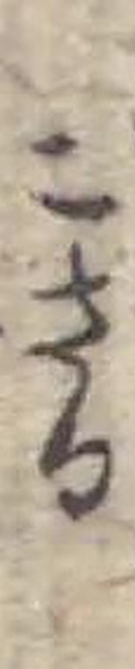ござる
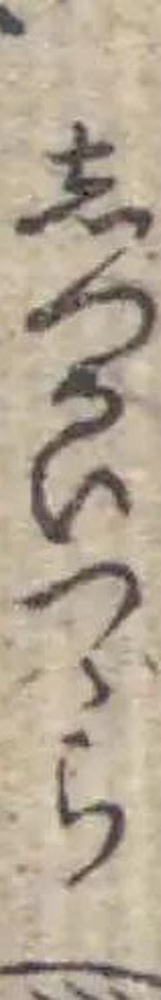しつかいつゞら
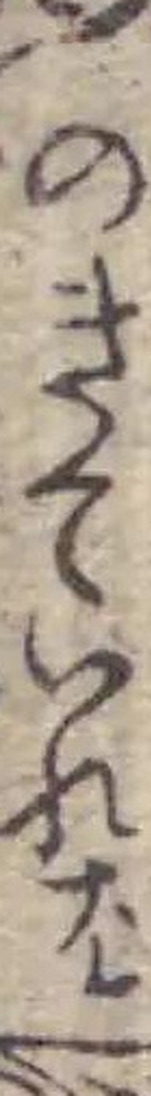のきていれば
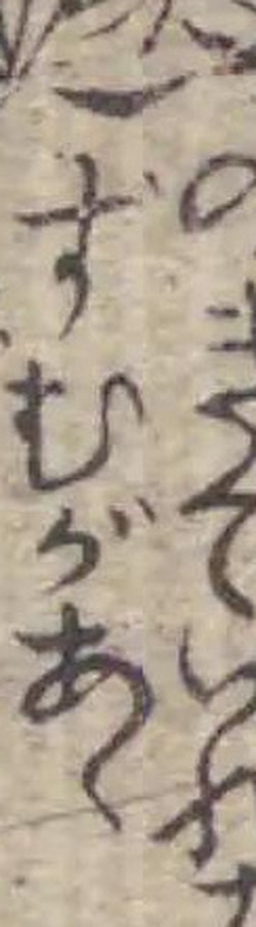すむがあゝ
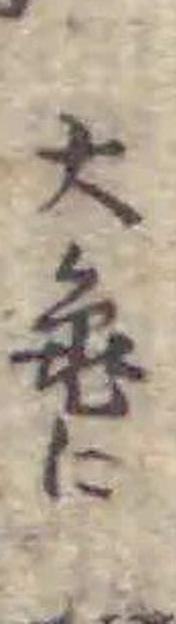大亀に
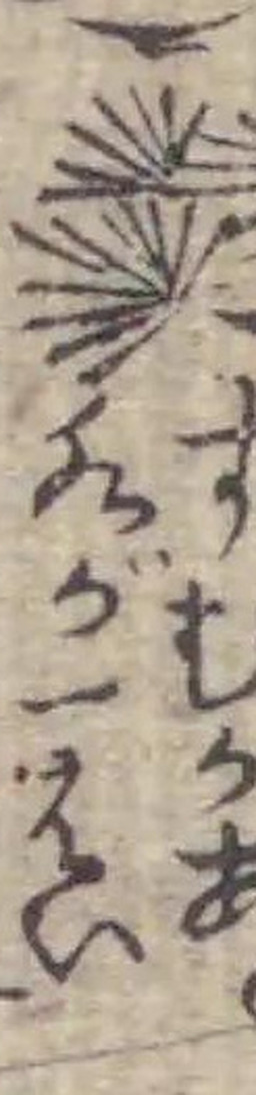水が一はい
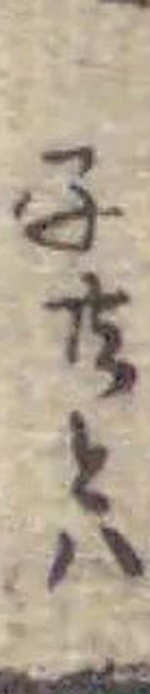子共とは
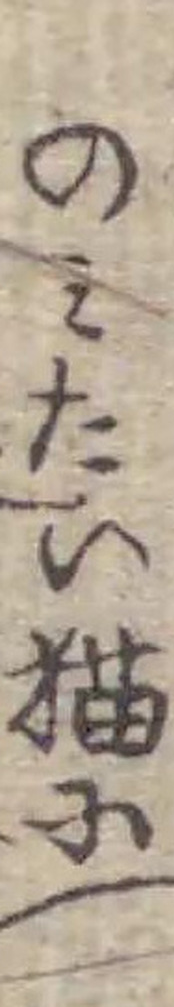のみたい猫に
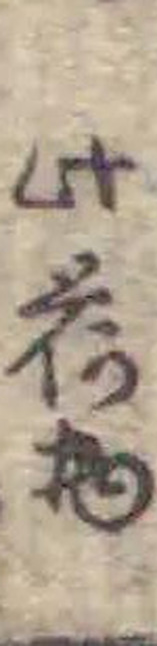此荷物
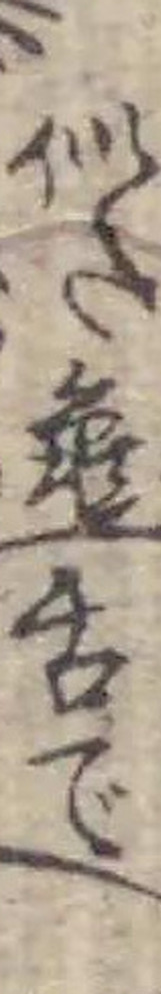似た亀舌で
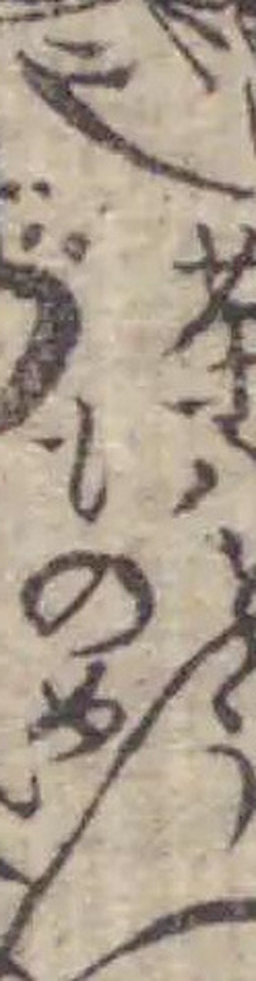ものめ
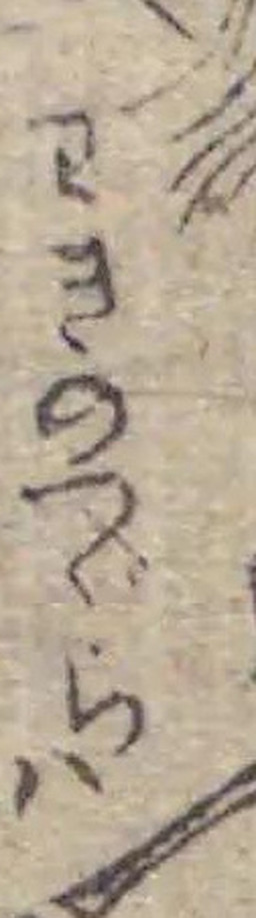わきのつゞらは
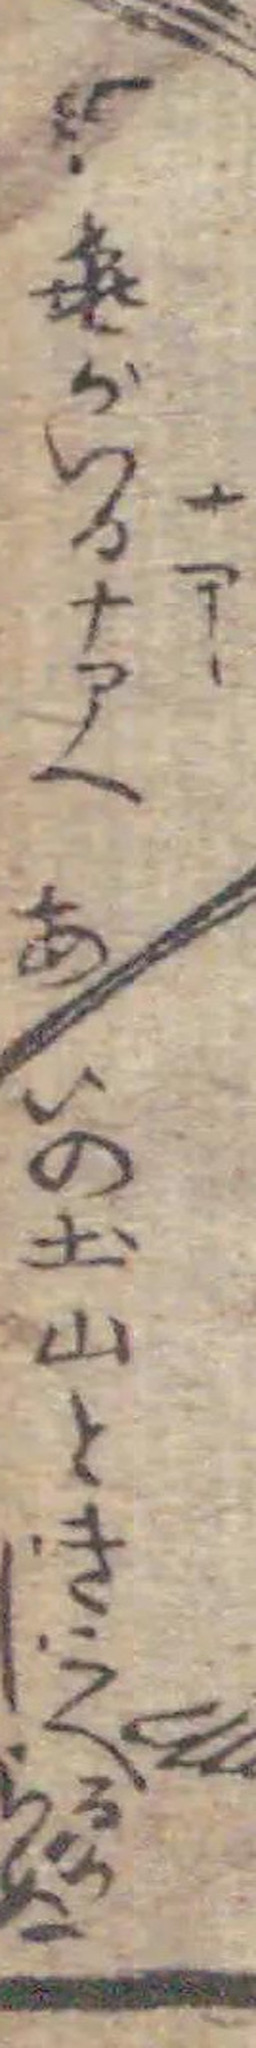亀がいるナアヘあいの土山ときこえるかめ
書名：見立蓬莱 : 2巻
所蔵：国立国会図書館 National Diet Library, JAPAN
